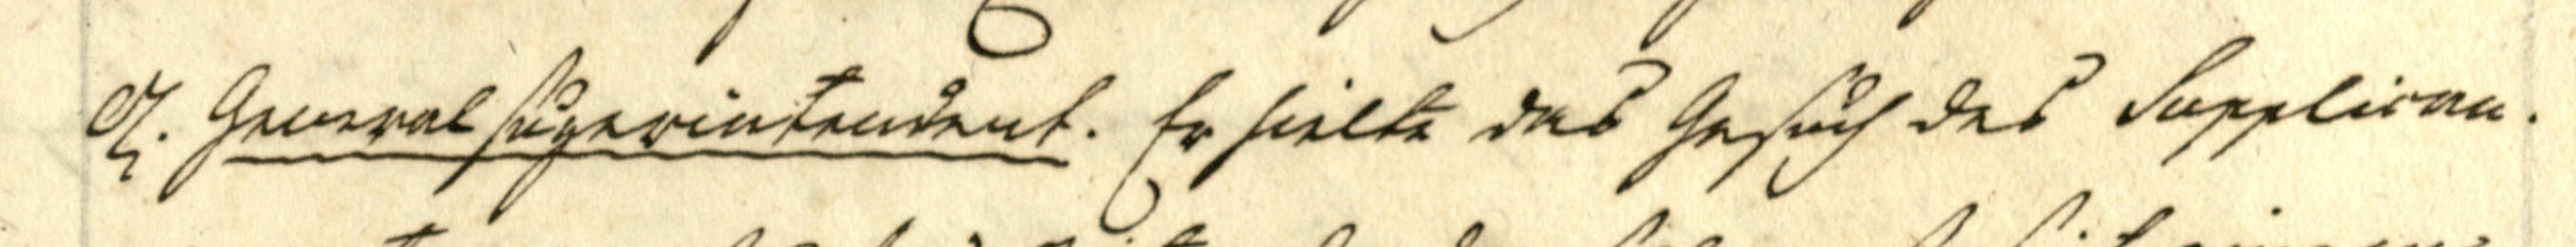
dh. Generalsuperintendent. Er hielte das Gesuch des Supplican¬
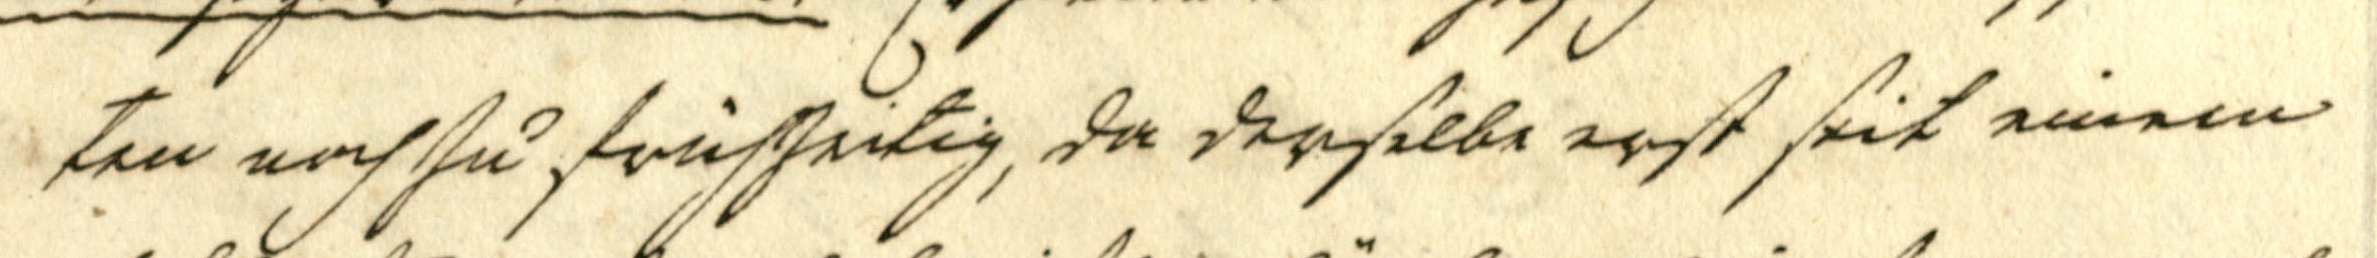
ten noch zu frühzeitig, da derselbe erst seit einem
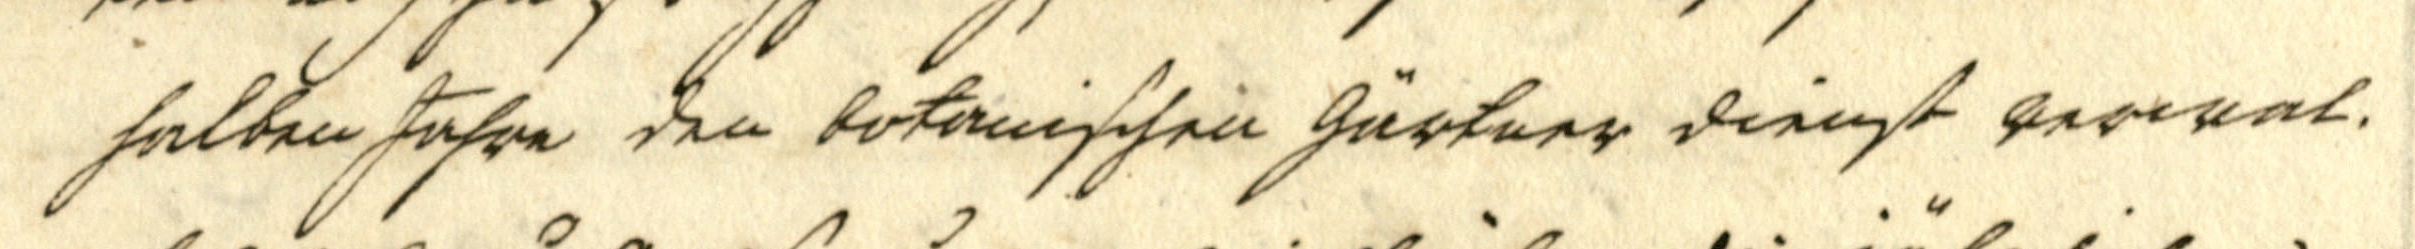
halben Jahre den botanischen Gärtner dienst verwal¬
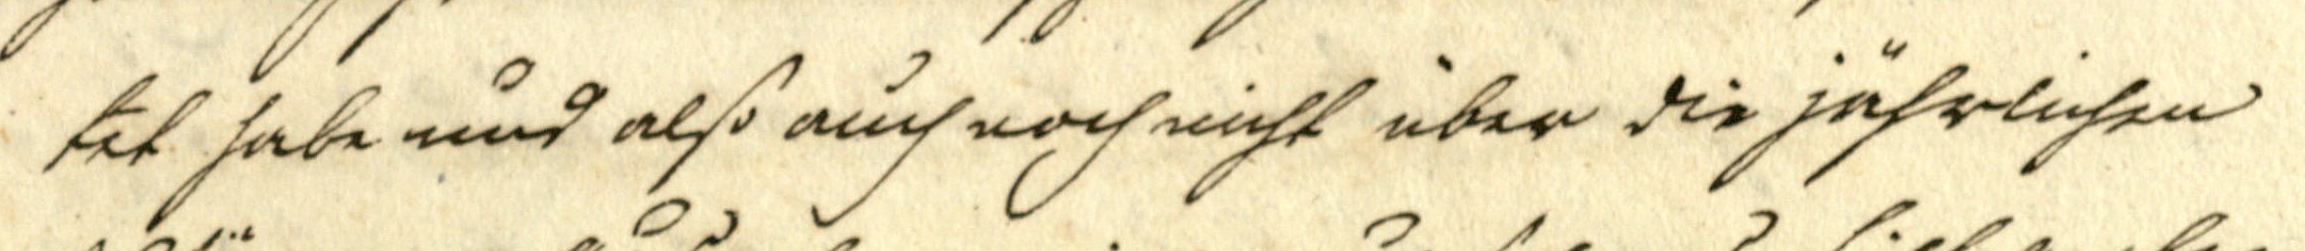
tet habe und also auch noch nicht über die jährlichen
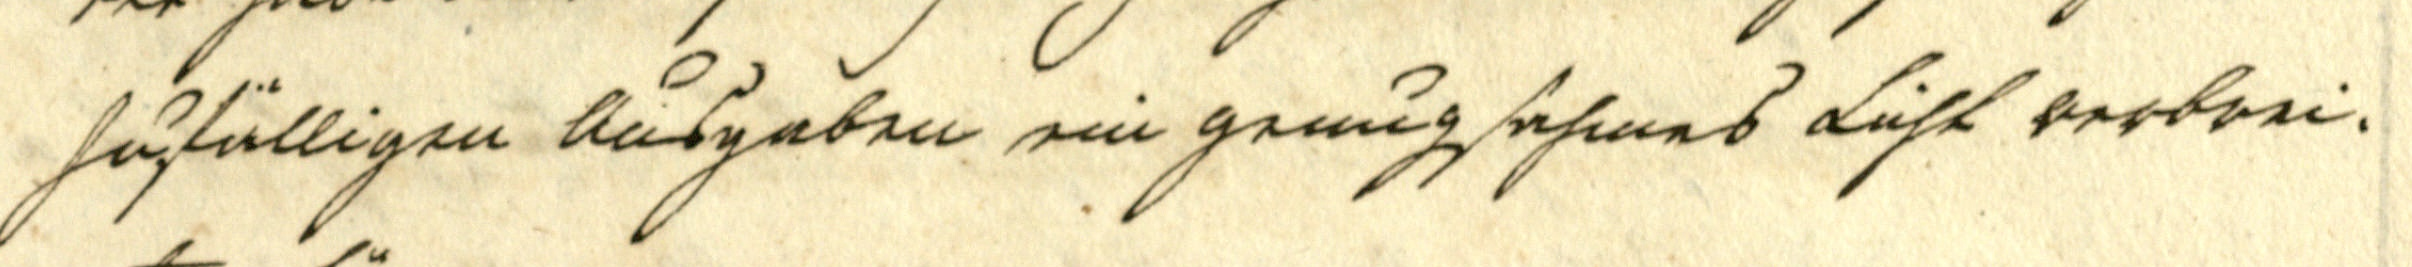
zufälligen Ausgaben ein genugsahmes Licht verbrei¬
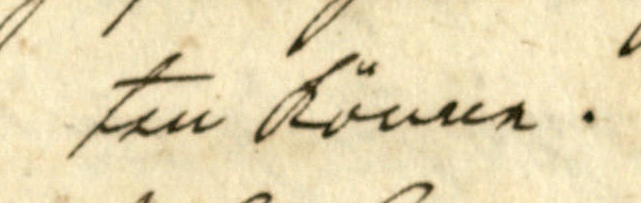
ten könne.
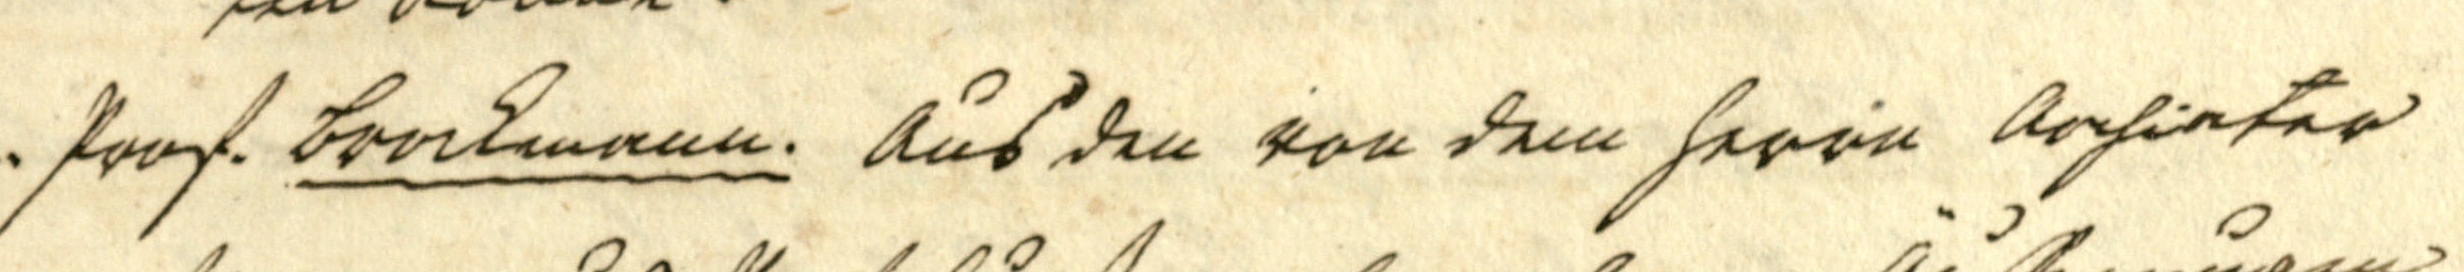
Prof. Brockmann. Aus den von dem Herrn Archiater
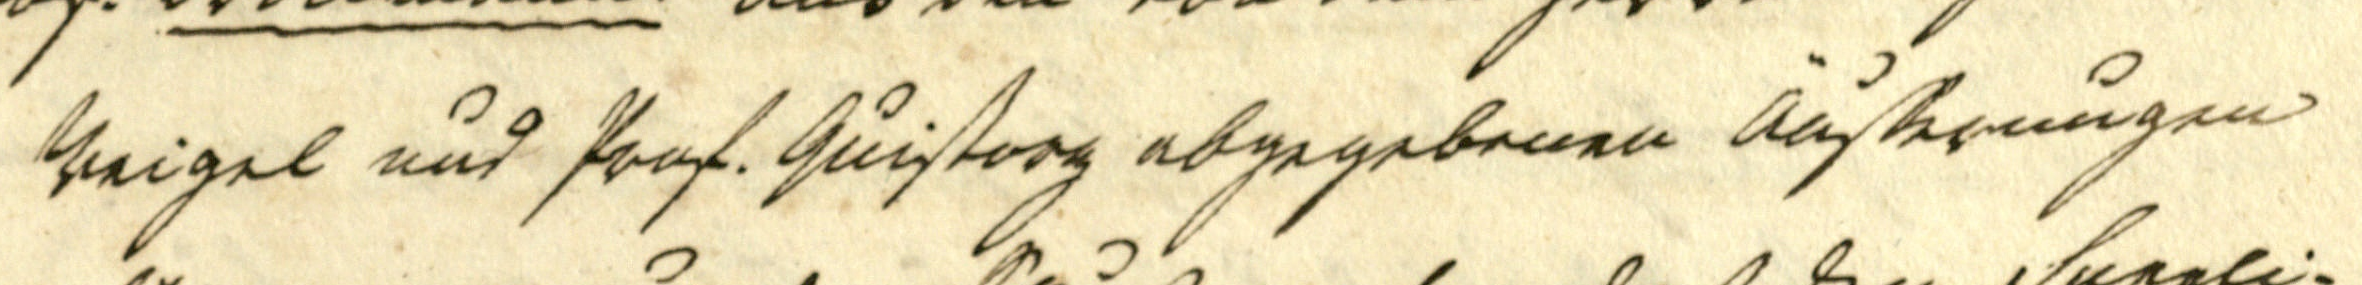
Weigel und Prof. Quistorp abgegebenen Äusserungen
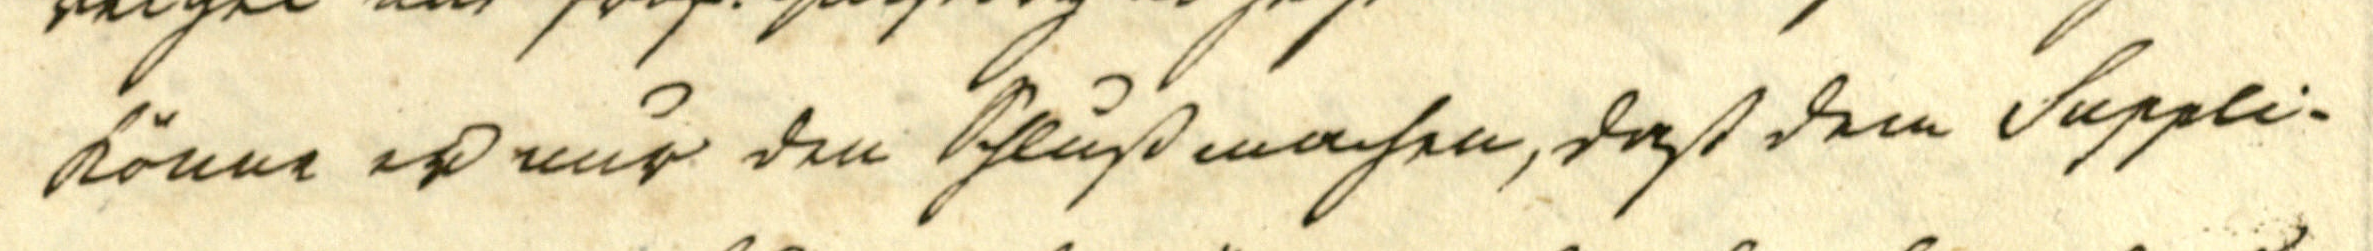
könne er nur den Schluß machen, daß dem Suppli¬
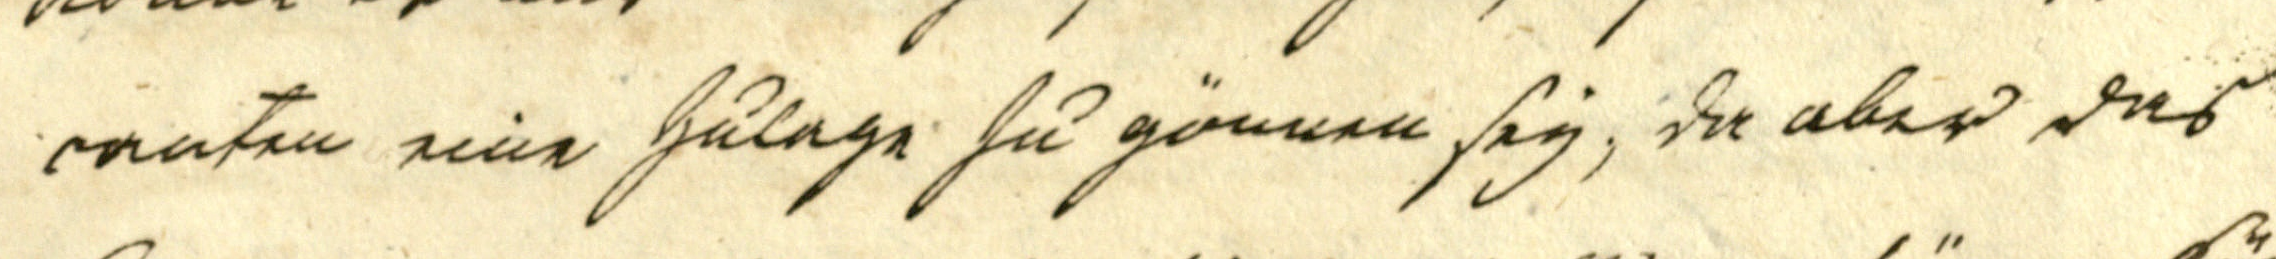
canten eine Zulage zu gönnen seÿ, da aber das
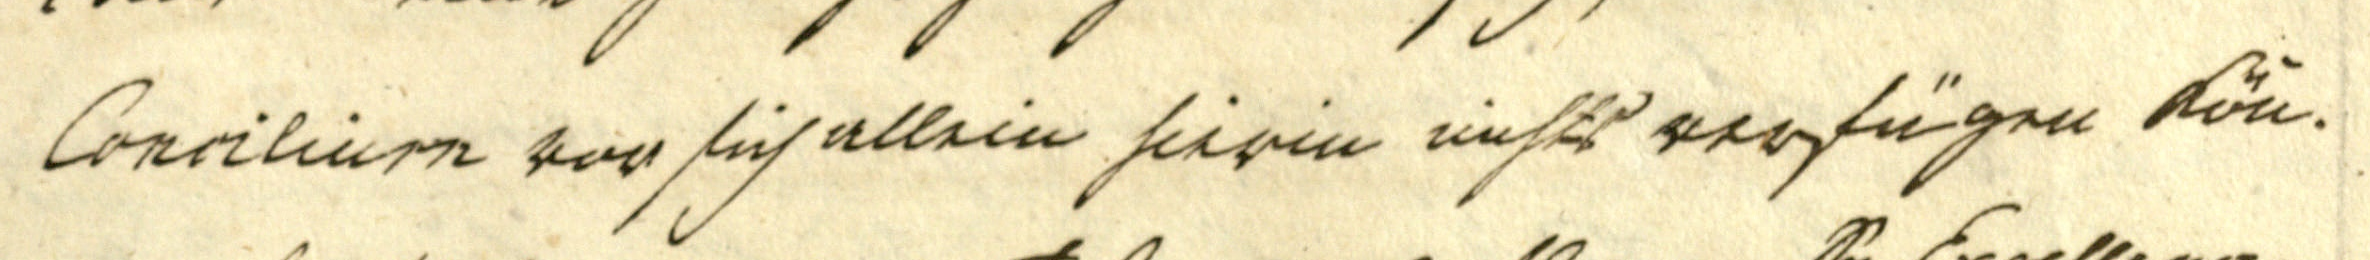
Concilium vor sich allein hierin nichts verfügen kön¬
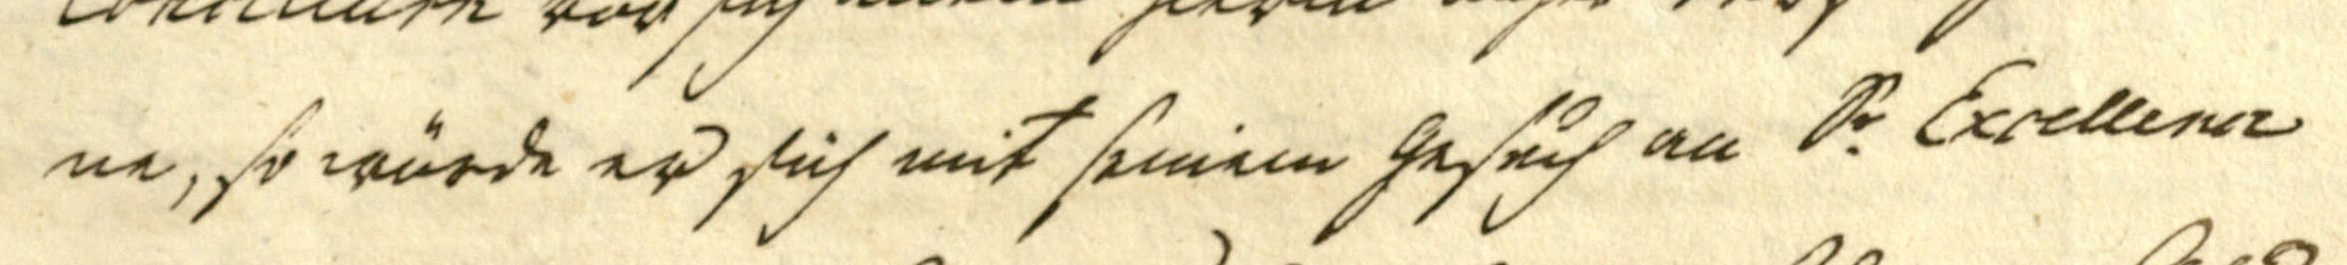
ne, so würde er sich mit seinem Gesuch an Sr. Excellence
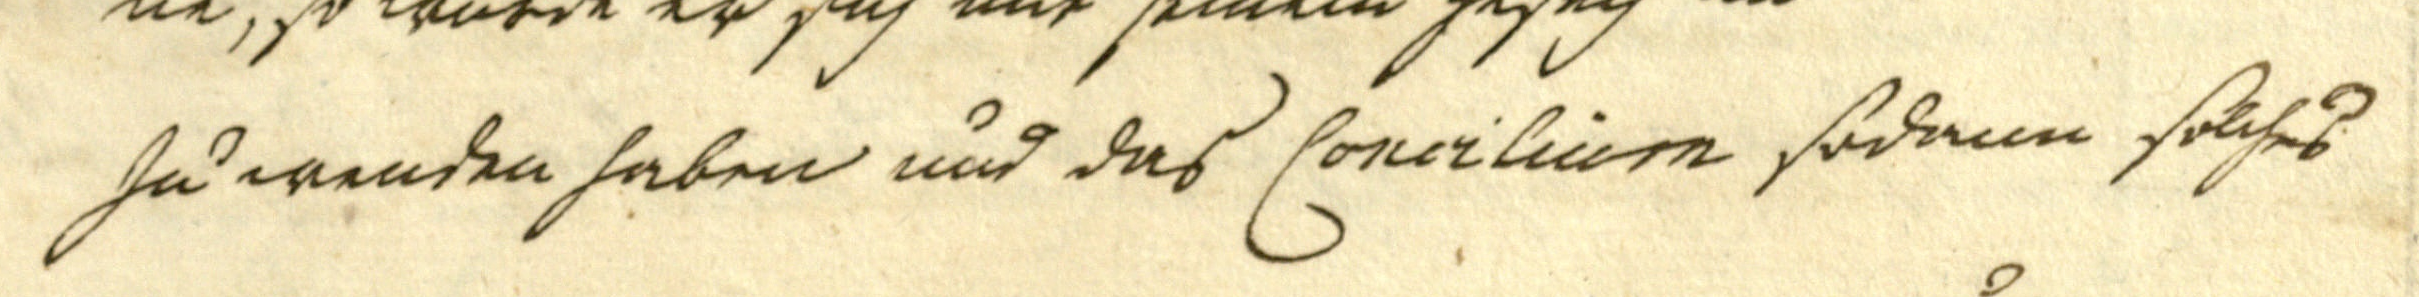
zu wenden haben und das Concilium sodann solches
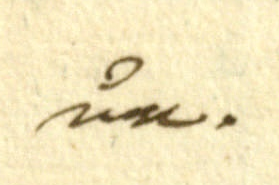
un-
